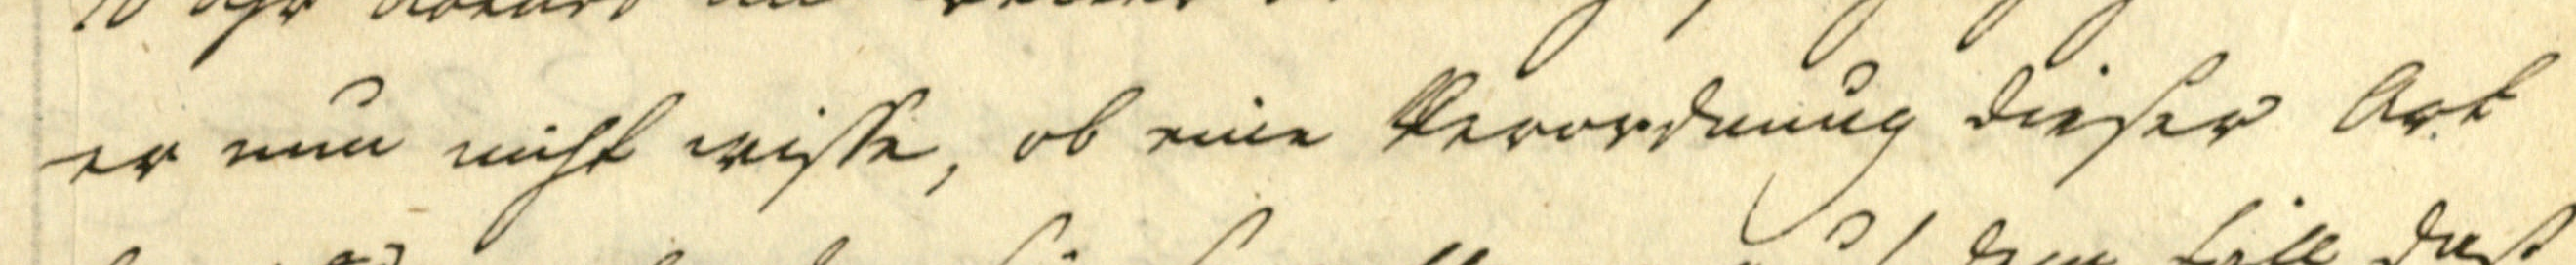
er nun nicht wisse, ob eine Verordnung dieser Art
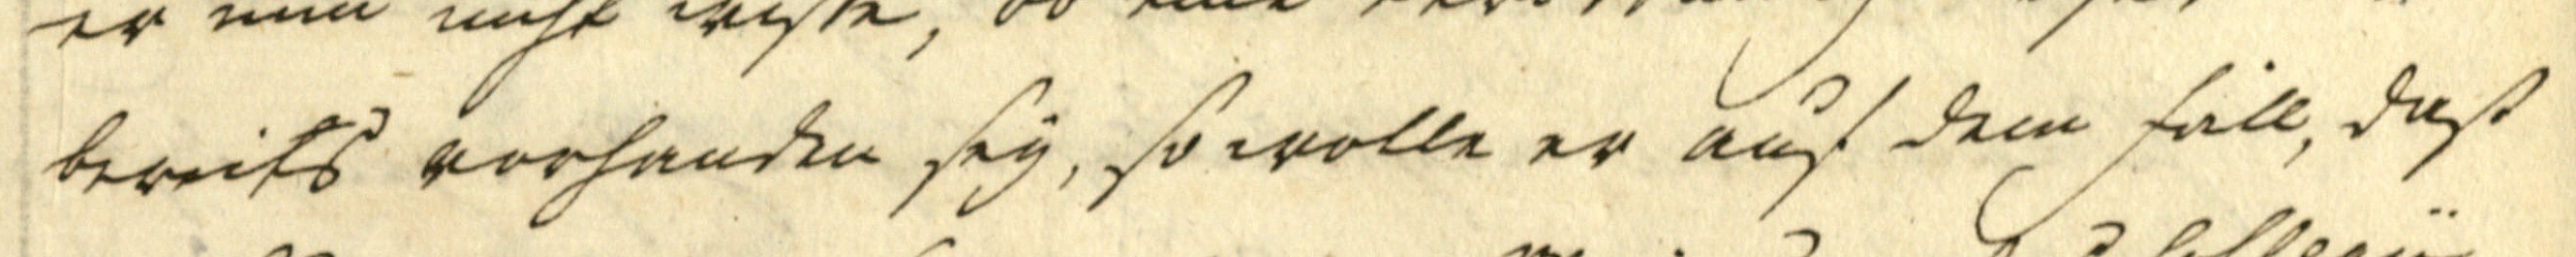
bereits vorhanden seÿ, so wolle er auf dem Fall, daß
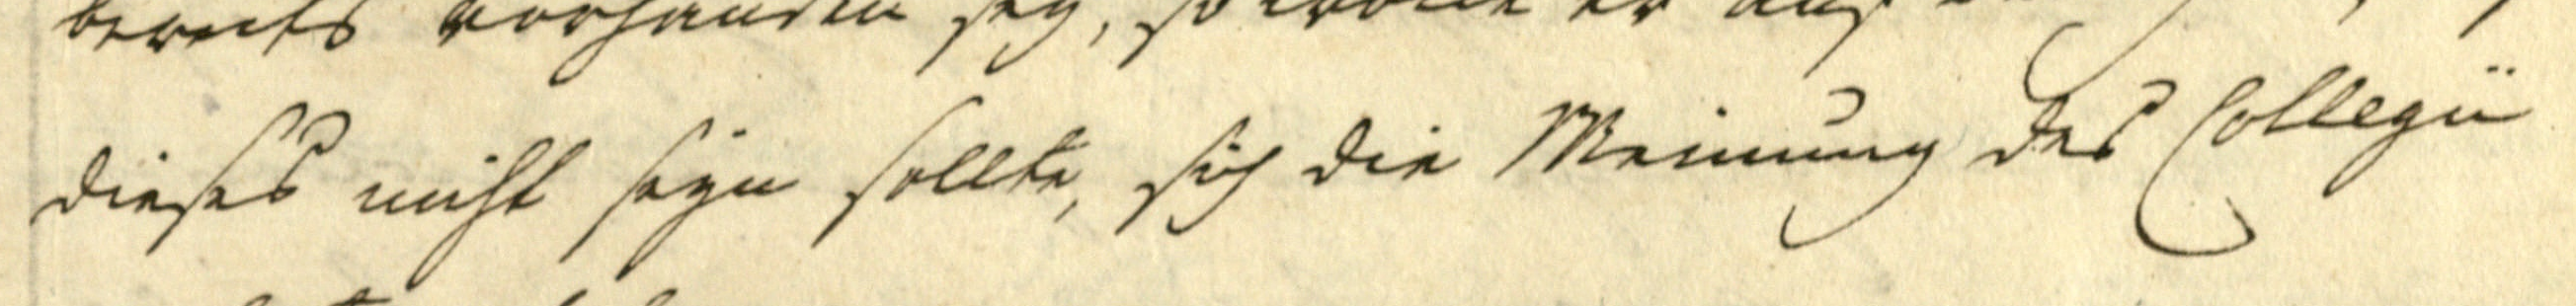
dieses nicht seÿn sollte, sich die Meinung des Collegii
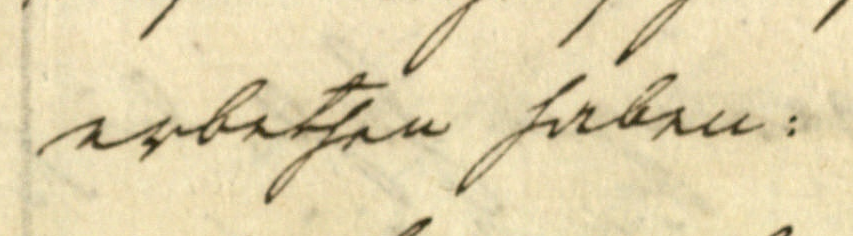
erbethen haben:
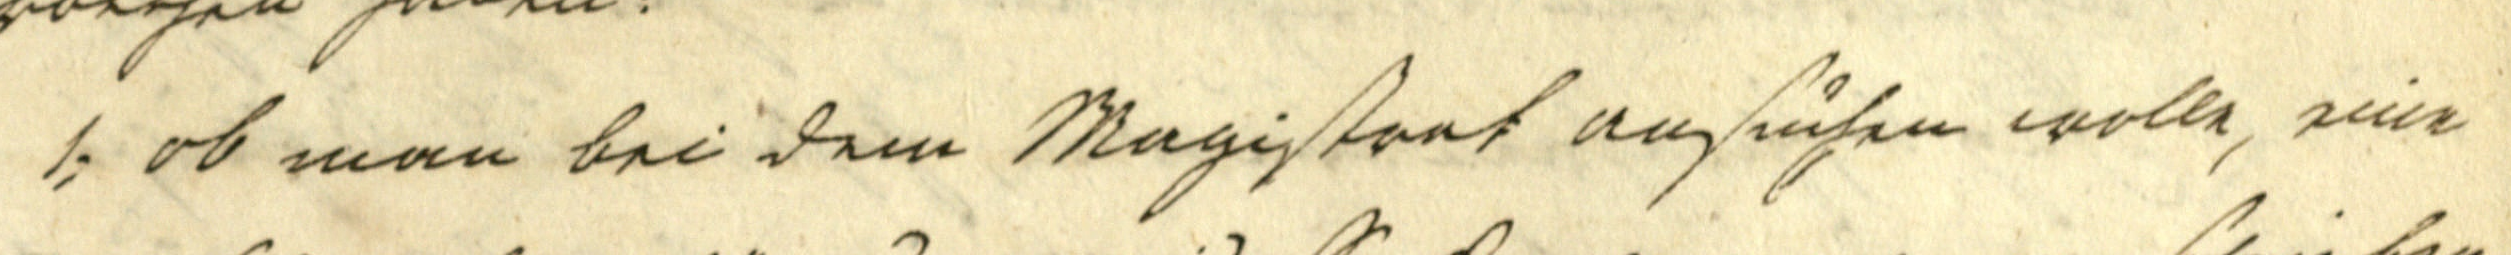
1. ob man bei dem Magistrat ansuchen wolle, eine
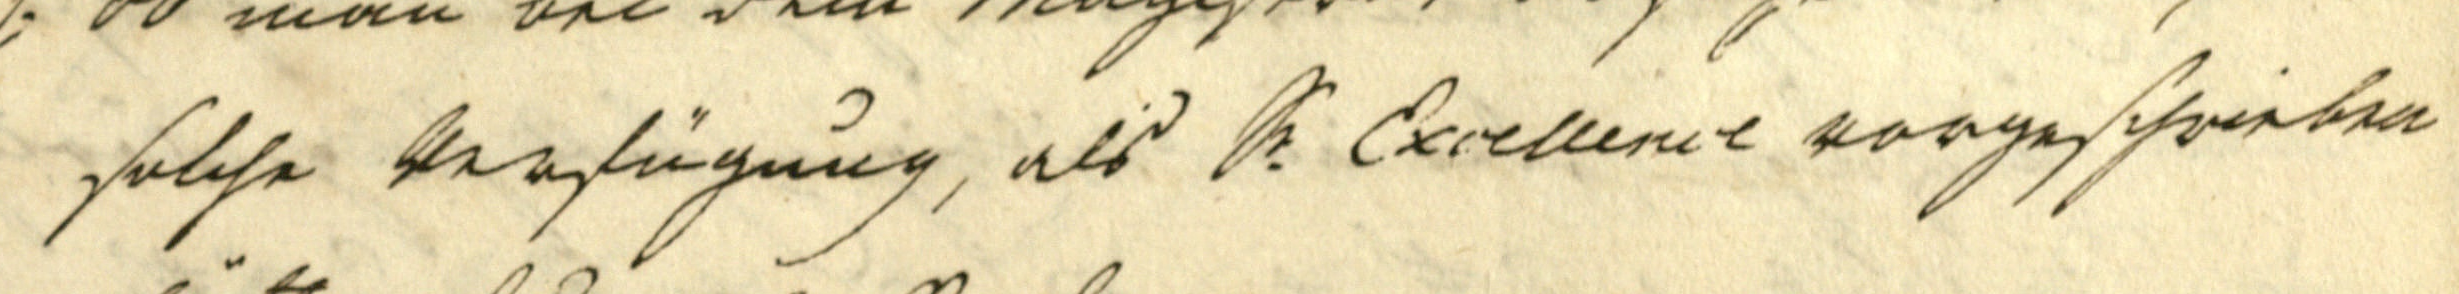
solche Verfügung, als Sr Excellence vorgeschrieben
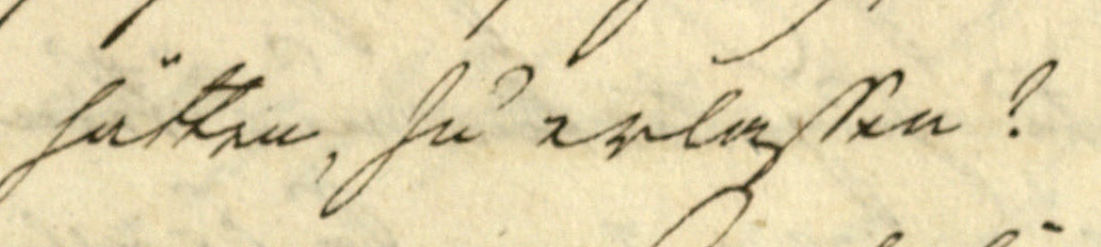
hätten, zu erlassen?
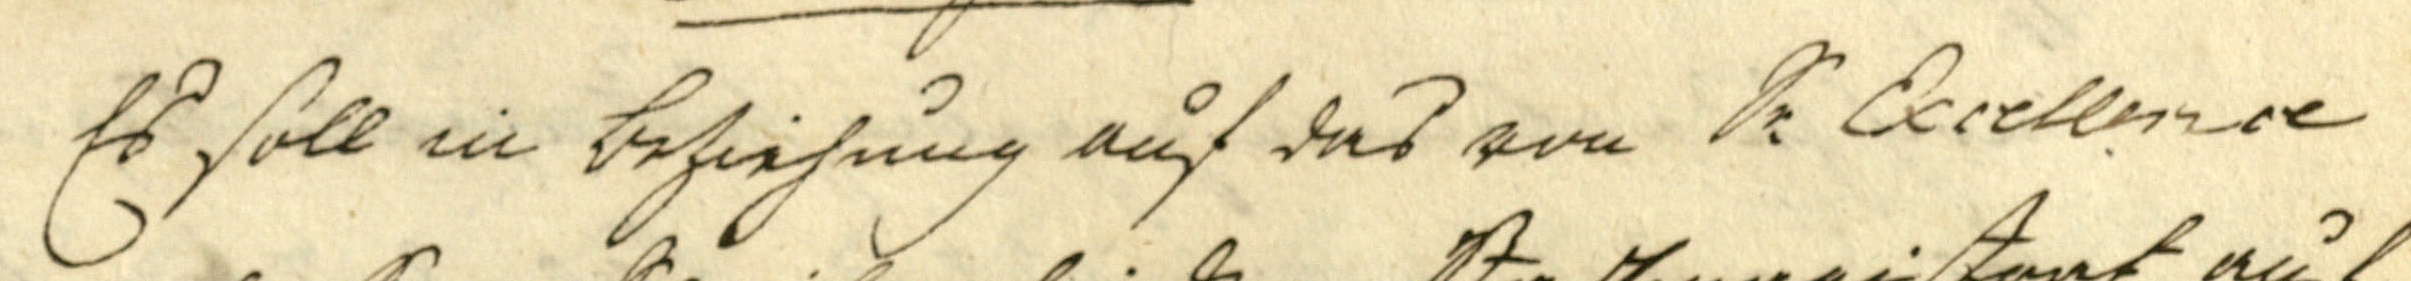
Es soll in Beziehung auf das von Sr Excellence
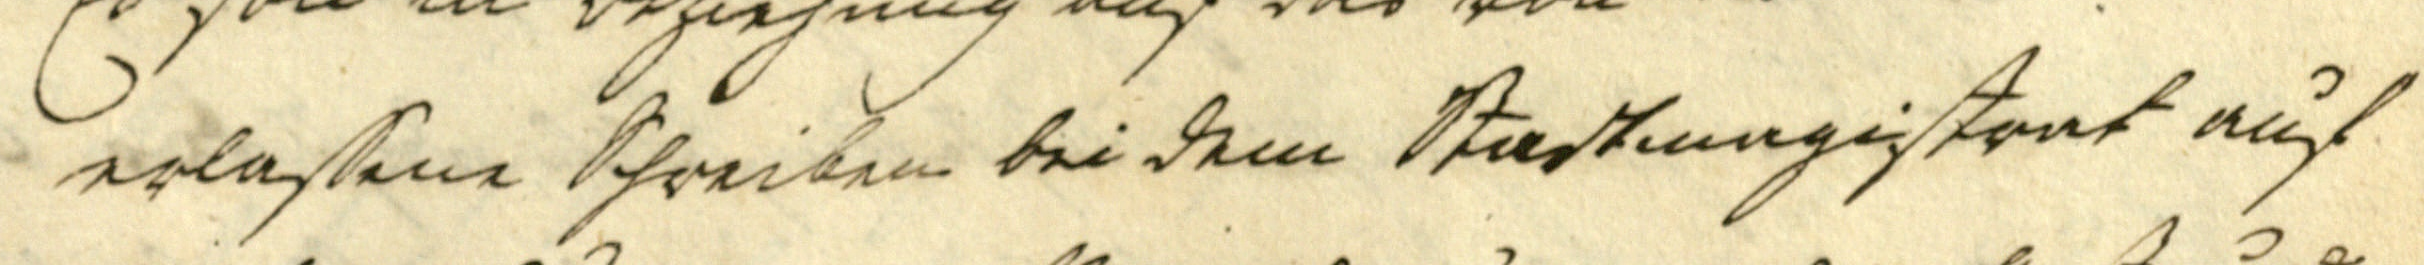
erlassene Schreiben bei dem Stadtmagistrat auf
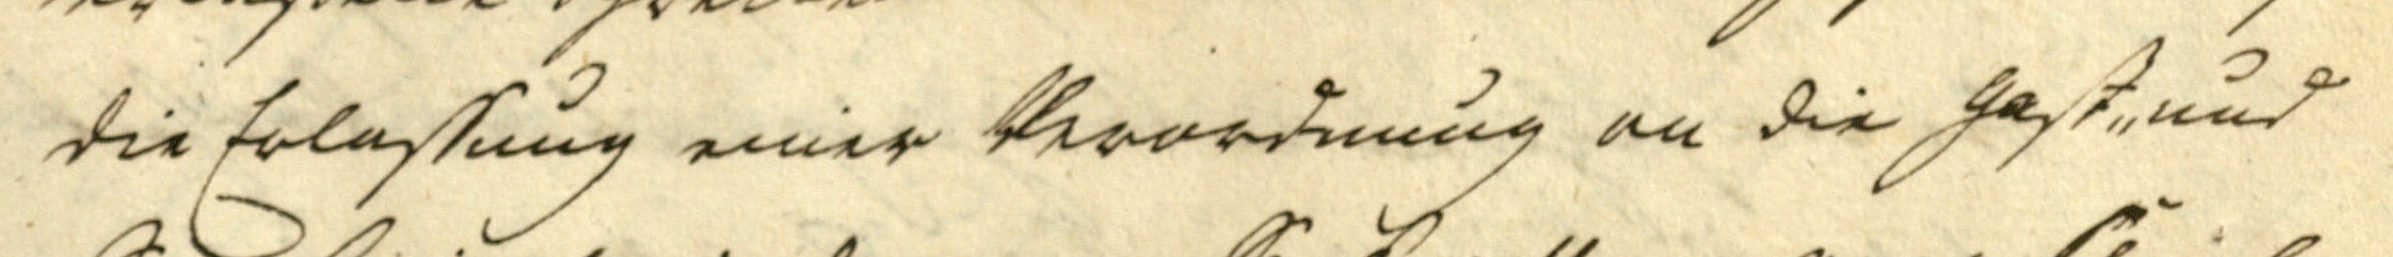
die Erlassung einer Verordnung an die Gast- und
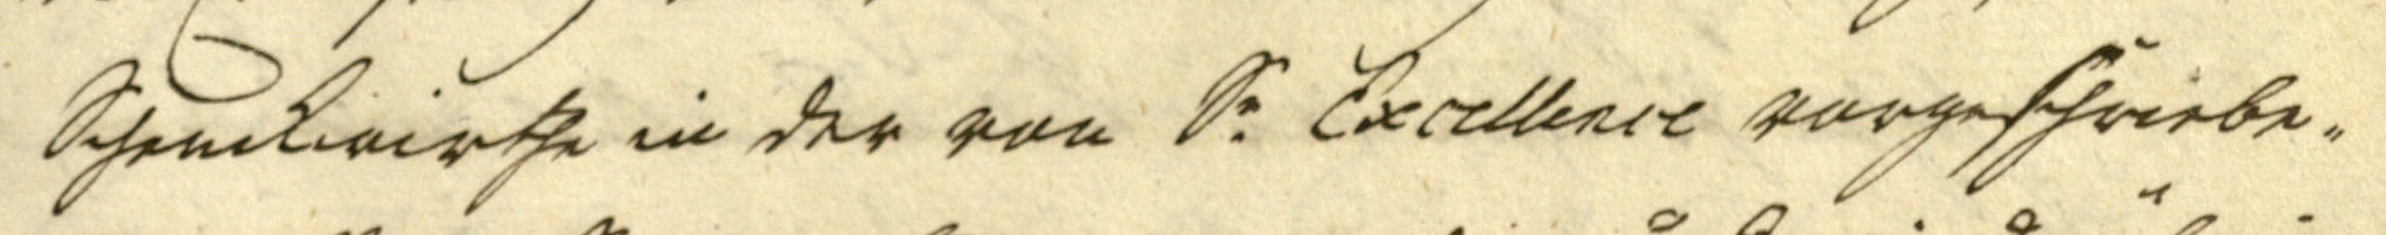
Schenckwirthe in der von Sr Excellence vorgeschriebe¬
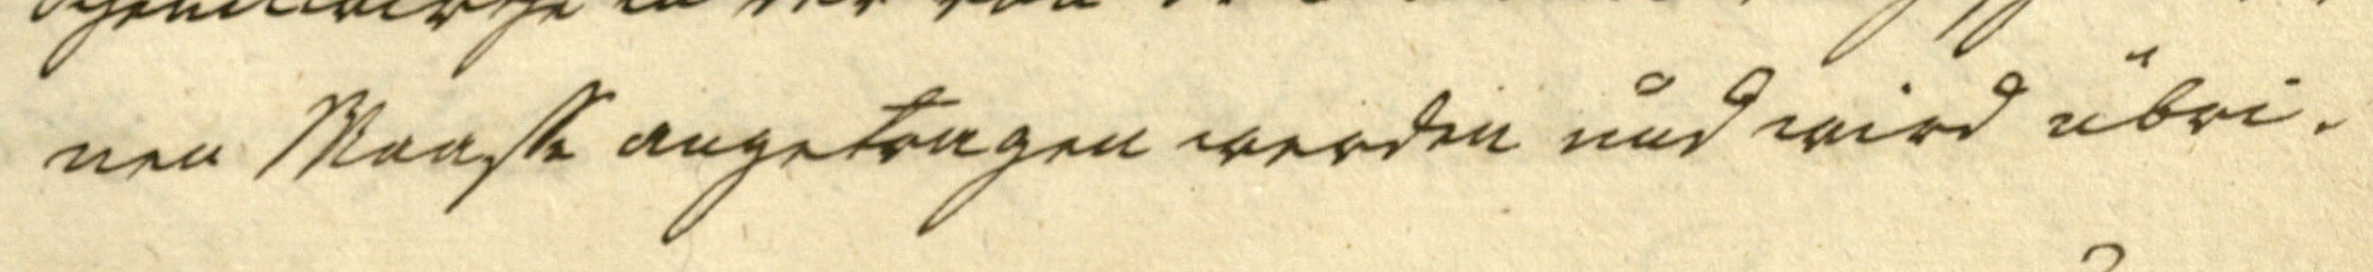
nen Maasse angetragen werden und wird übri¬
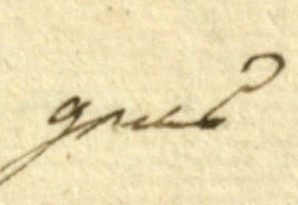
gens
